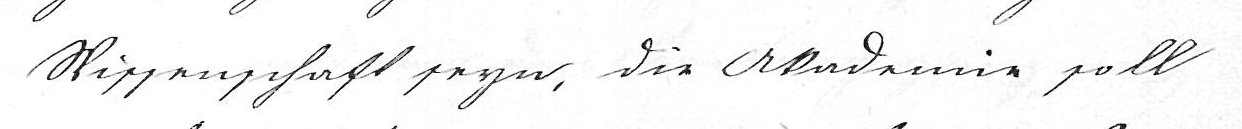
Wissenschaft seyn, die Akademie soll
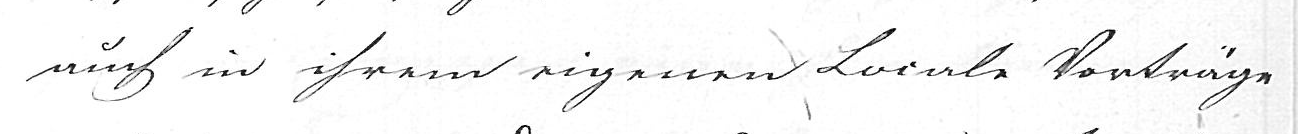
auch in ihren eigenen Locale Vorträge
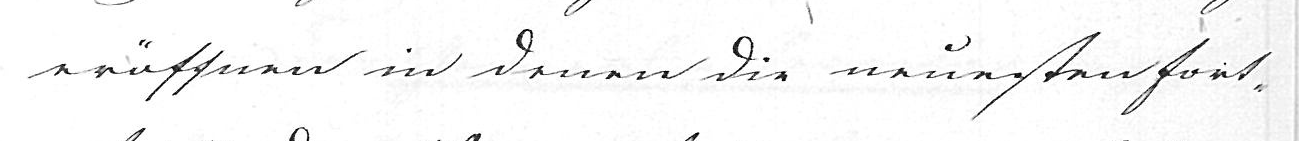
eröffnen in denen die neuesten Fort-
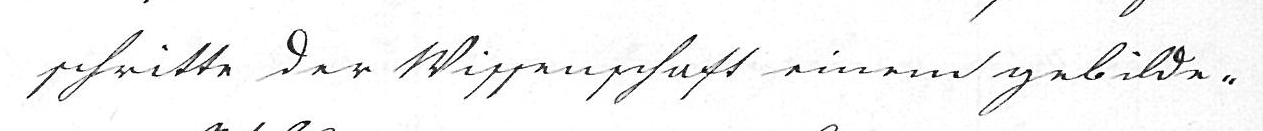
schritte der Wissenschaft einem gebilde-
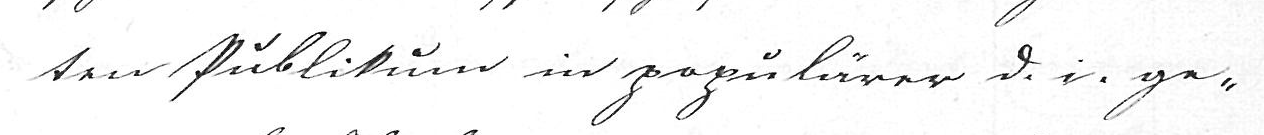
ten Publikum in populärer d. i. ge-
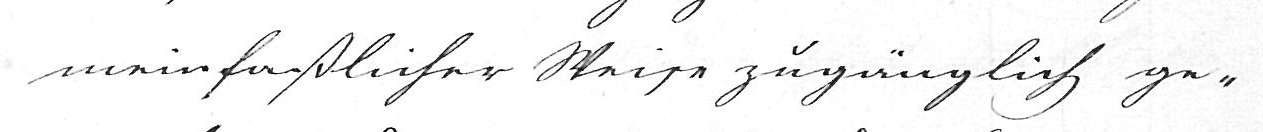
meinfaßlicher Weise zugänglich ge-
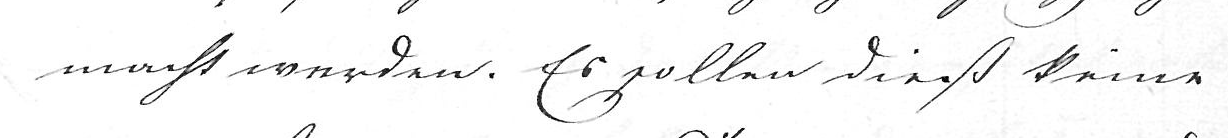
macht werden. Es sollen dieß keine
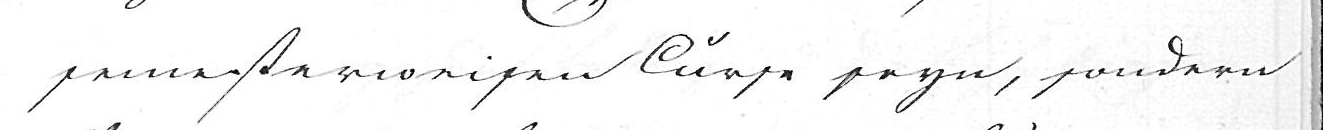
semesterweisen Curse seyn, sondern
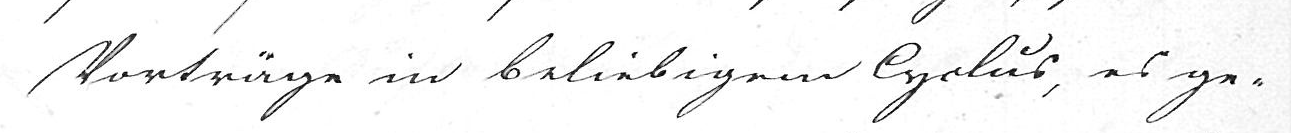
Vorträge in beliebigem Cyclus, es ge-
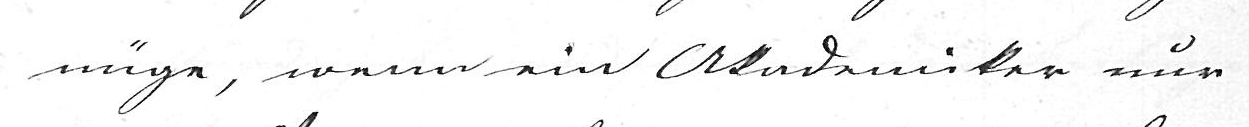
nüge, wenn ein Akademiker nur
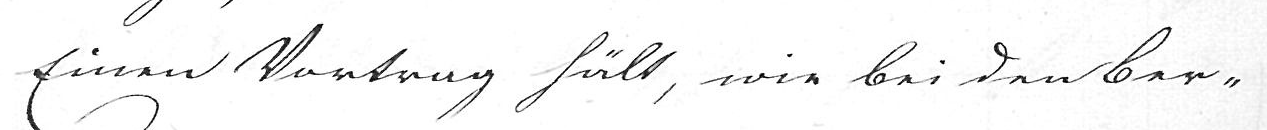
einen Vortrag hält, wie bei den Ber-
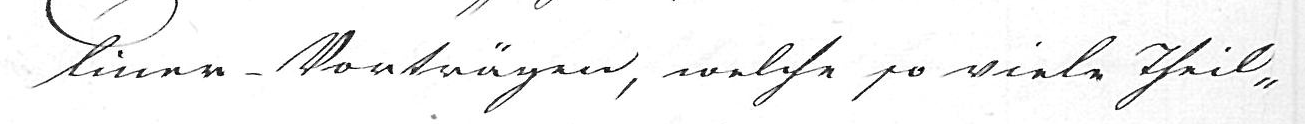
liner Vorträgen, welche so viele Theil-
